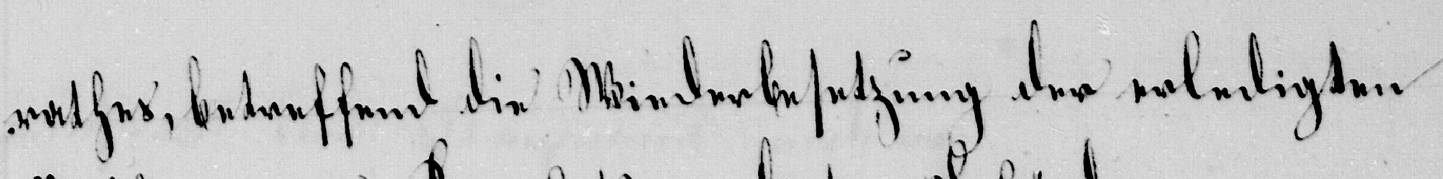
rathes, betreffend die Wiederbesetzung der erledigten
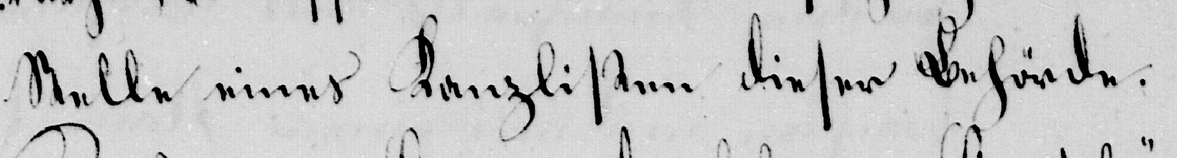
Stelle eines Kanzlisten dieser Behörde.
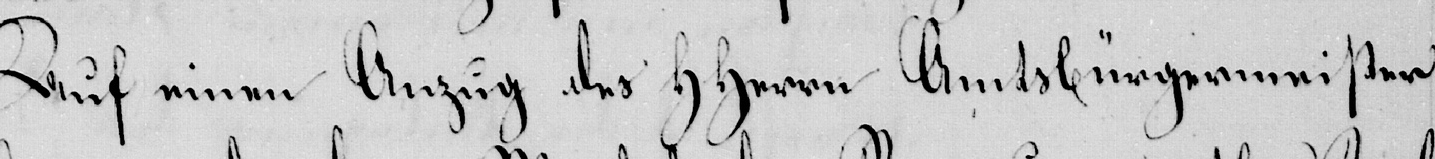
Auf einen Anzug des HHerrn Amtsbürgermeister
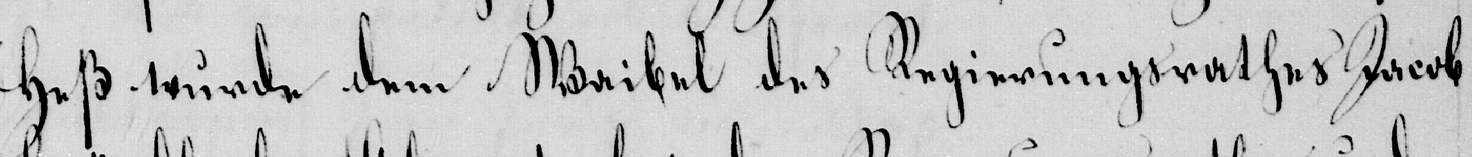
Heß wurde dem Waibel des Regierungsrathes Jacob
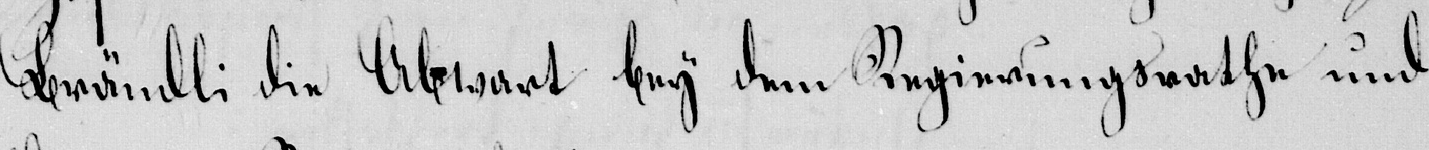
Brändli die Abwart bey dem Regierungsrathe und
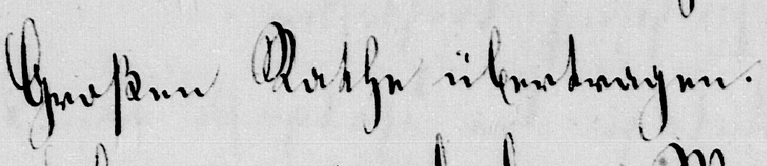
Großen Rathe übertragen.
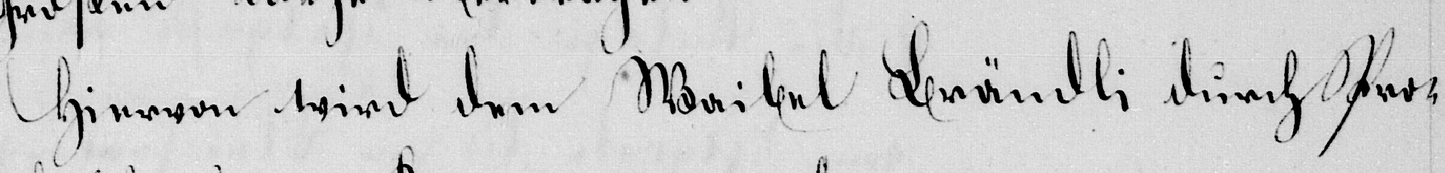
Hiervon wird dem Waibel Brändli durch Pro¬
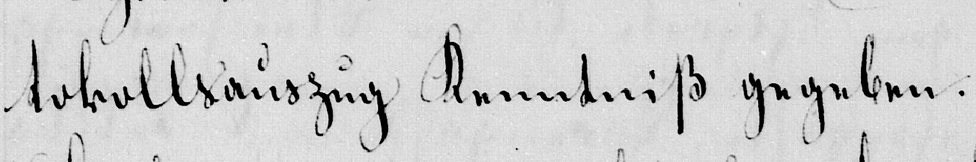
tokollsauszug Kenntniß gegeben.
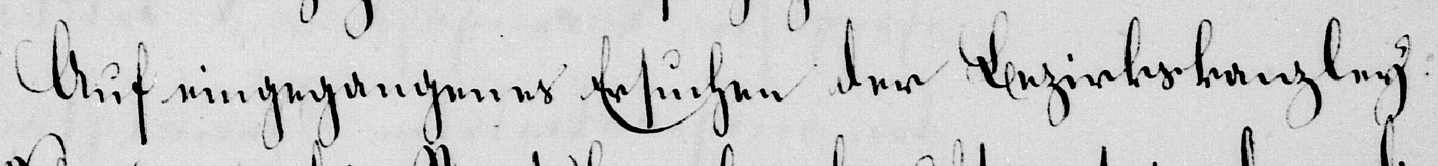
Auf eingegangenes Ersuchen der Bezirkskanzley
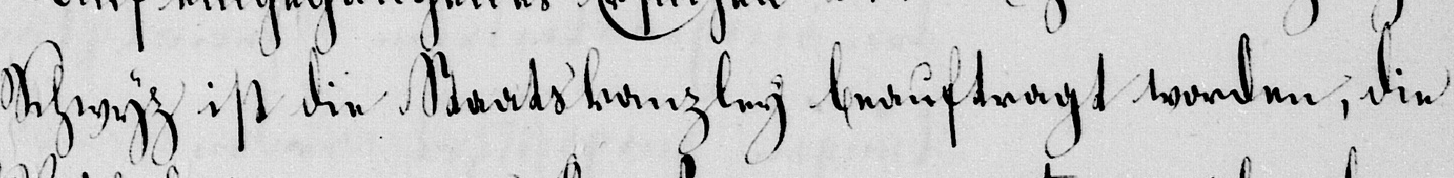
Schwyz ist die Staatskanzley beauftragt worden, die
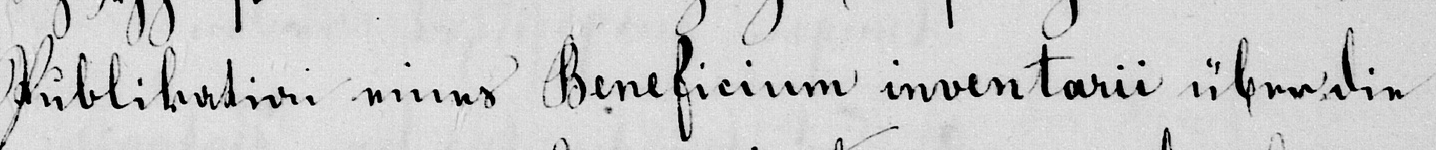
Publikation eines Beneficium inventarii über die
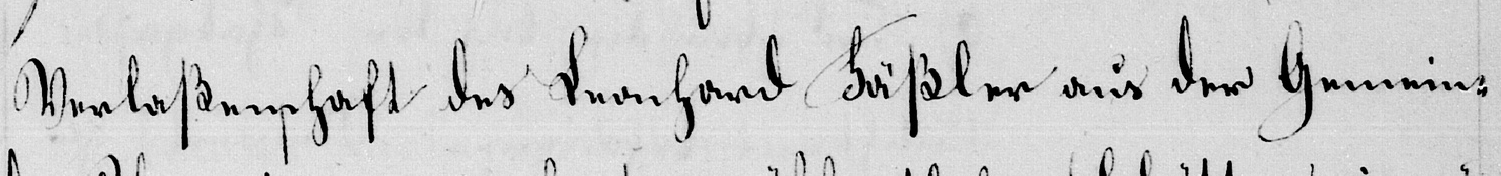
Verlaßenschaft des Leonhard Fäßler aus der Gemein¬
